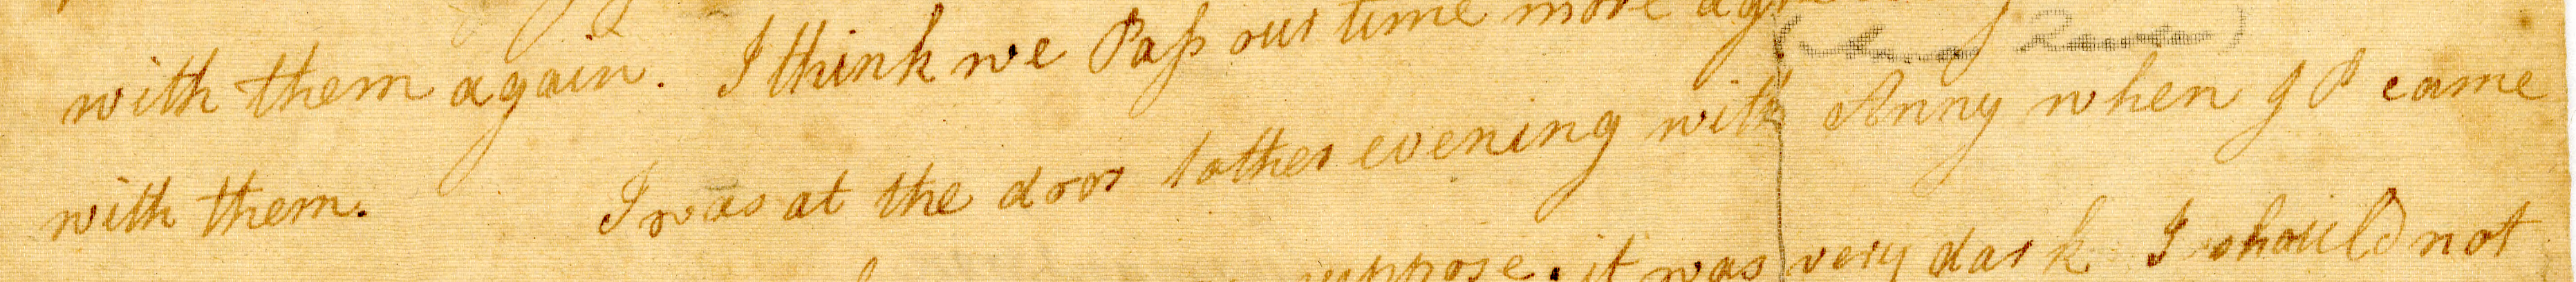with them. I was at the door 1 other evening with Anny when JP came
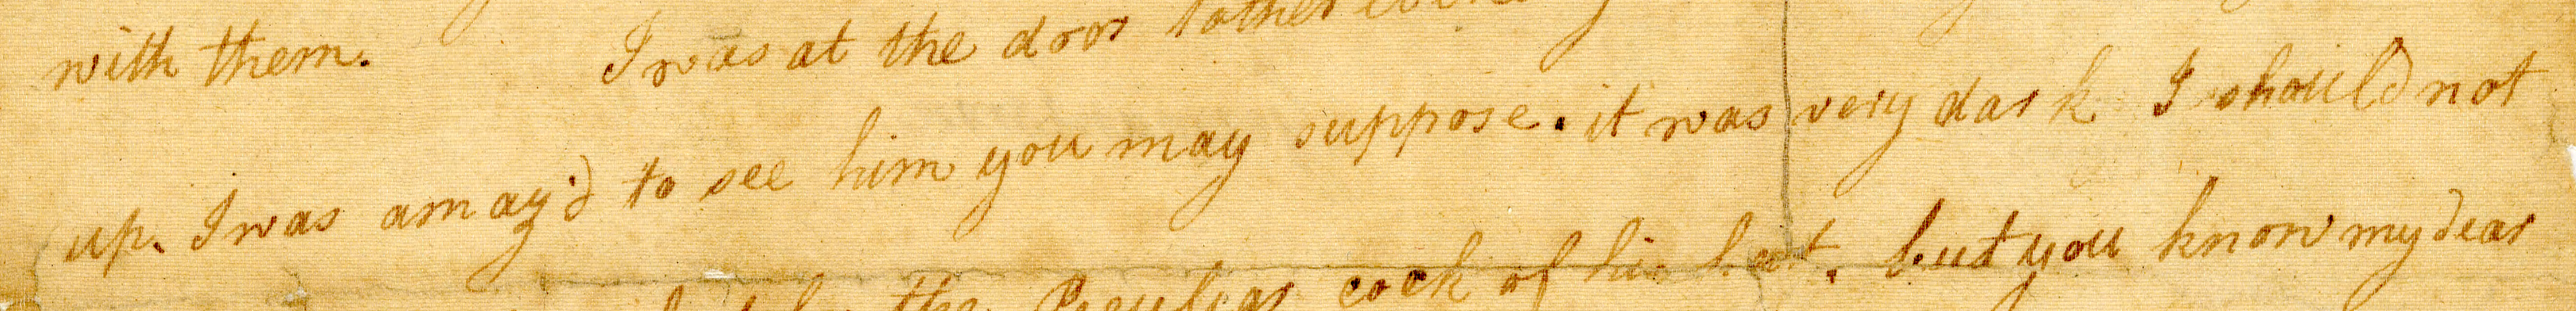up I was amazd to see him you may suppose it was very dark I should not
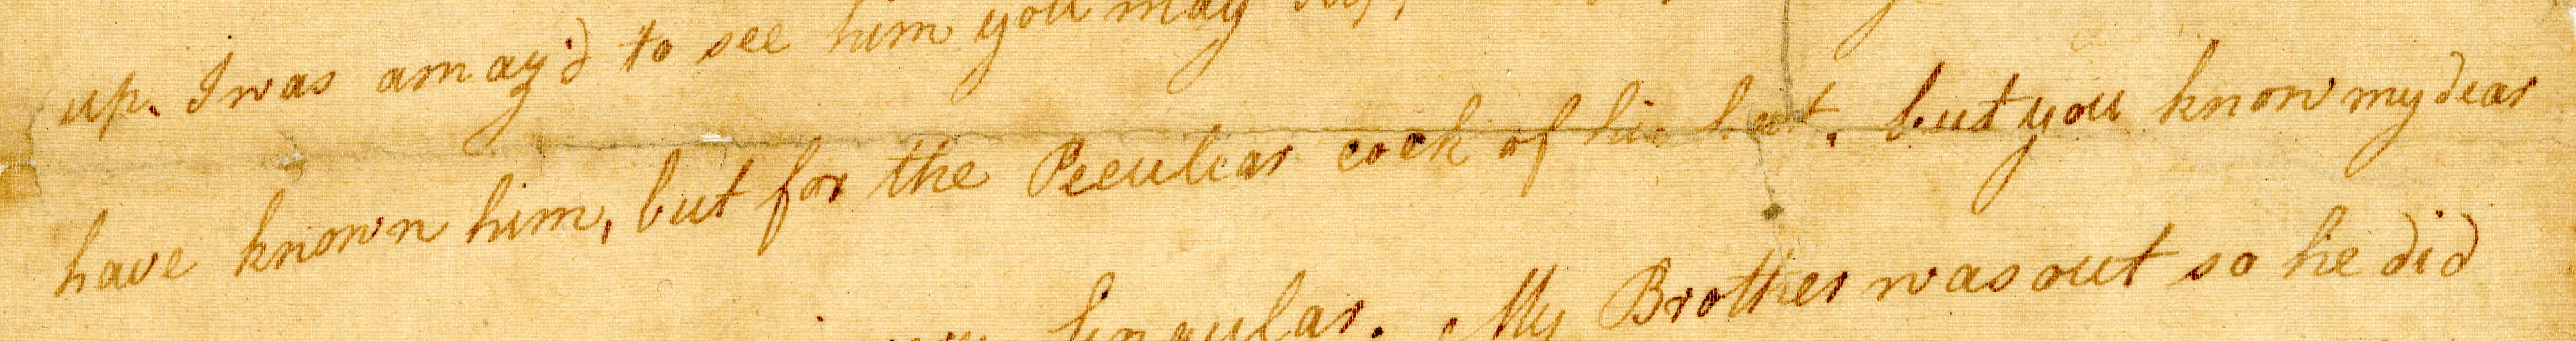have known him, but for the Peculiar cock of his hat but you know my dear
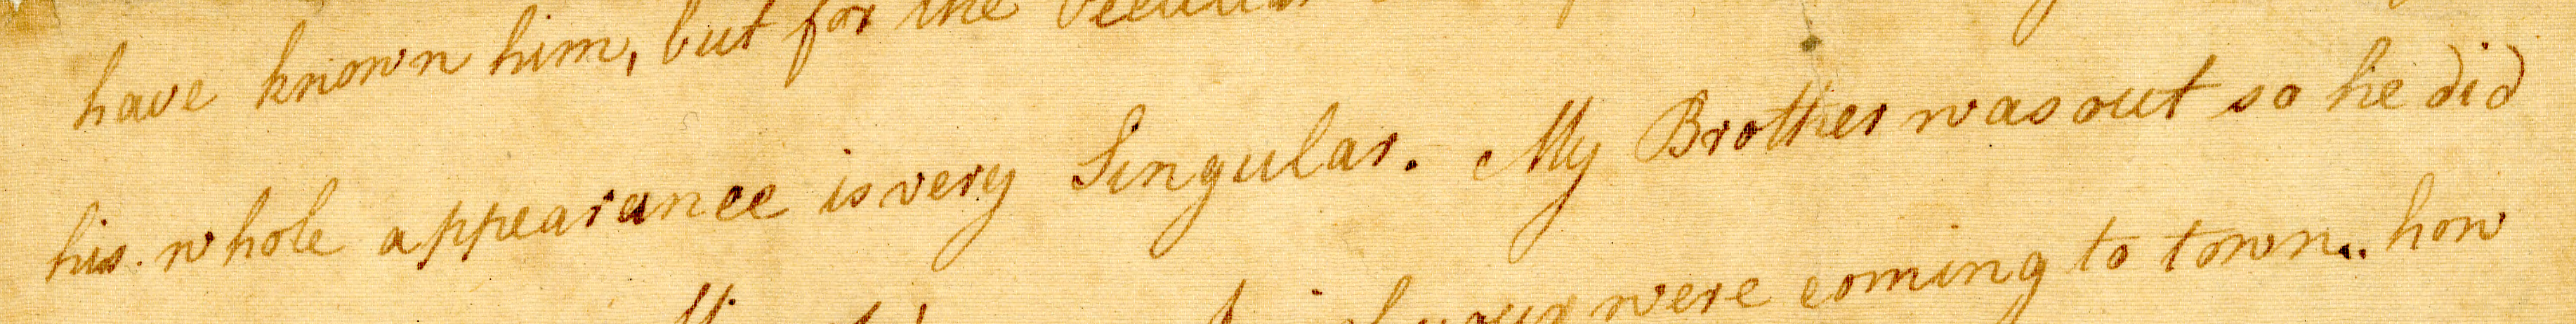his whole appearance is very Singular. My Brother was out so he did
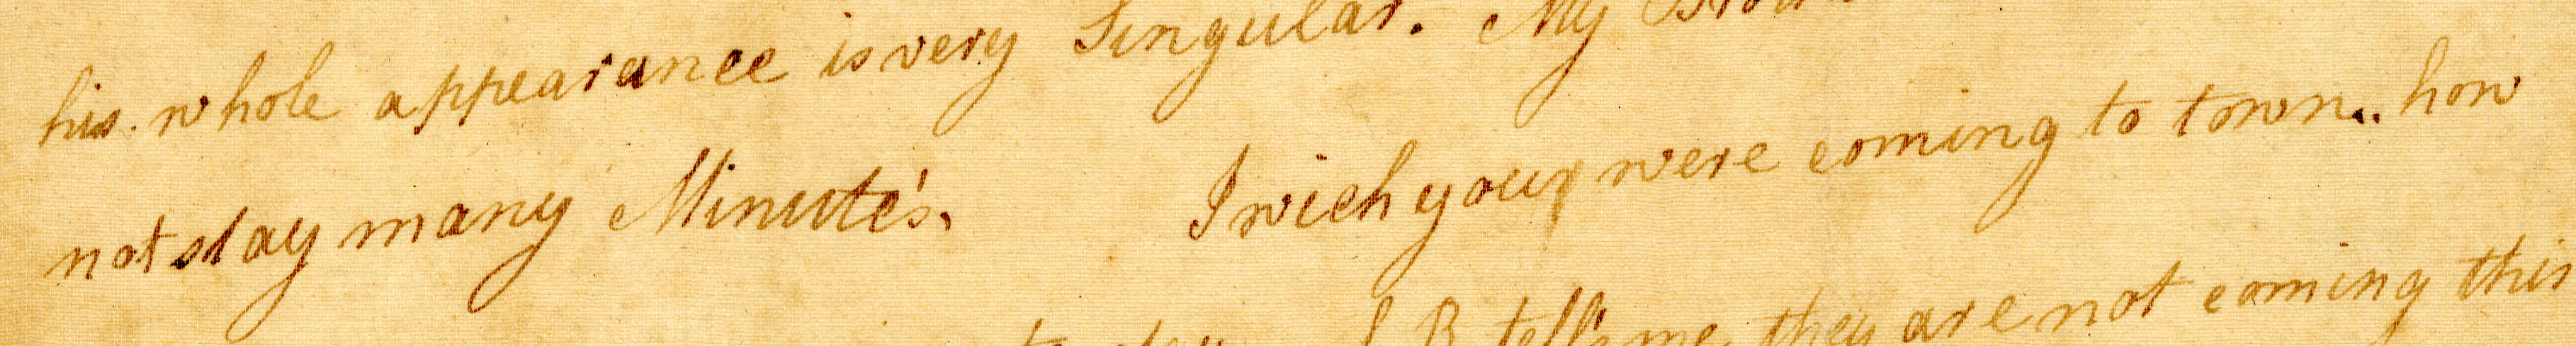not stay many Minute's. I wish you were coming to town how
